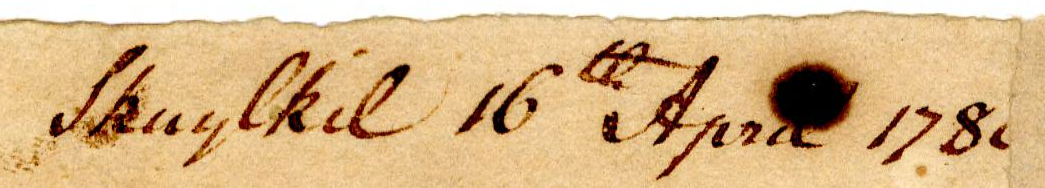Skuylkil 16^th April 1780
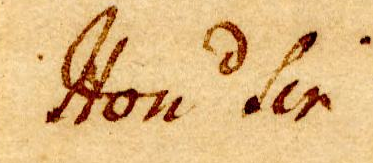Hon^d Sir
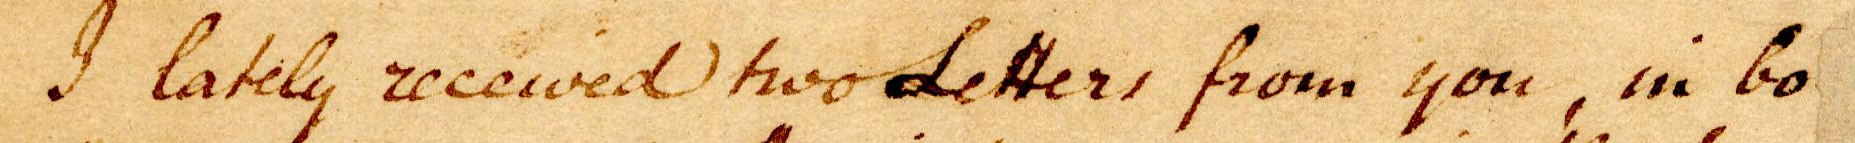I lately received two Letters from you, in bo
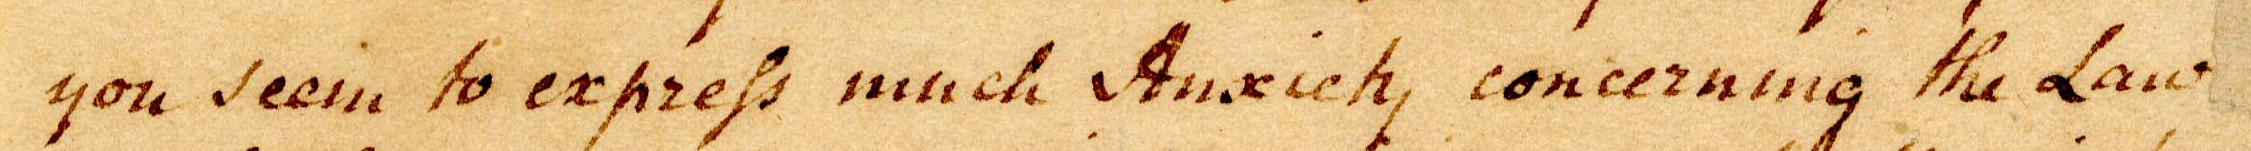you seem to express much Anxiety concerning the Law
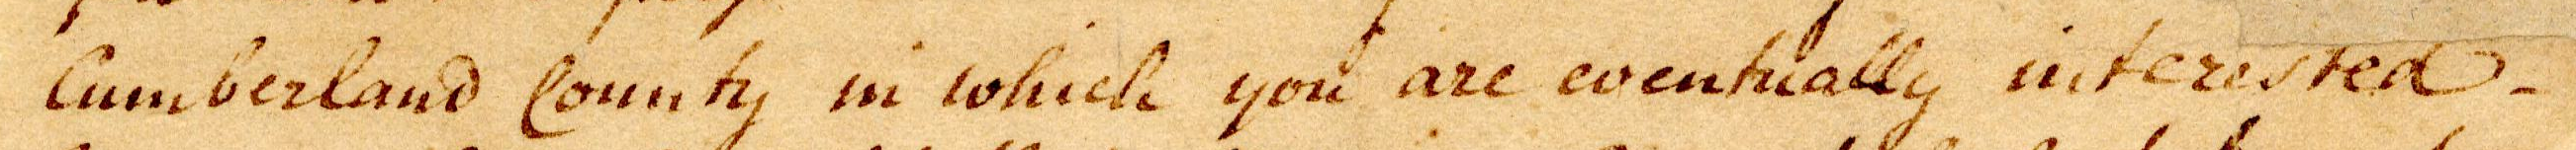Cumberland County in which you are eventually interested-
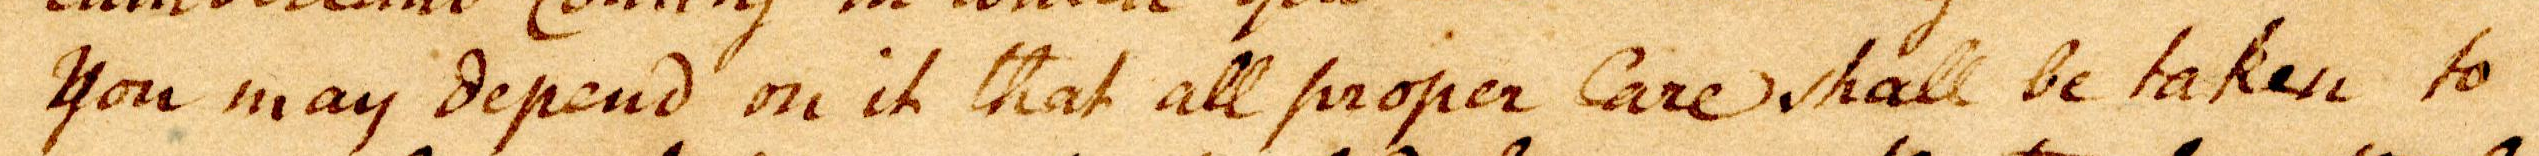You may depend on it that all proper Care shall be taken to
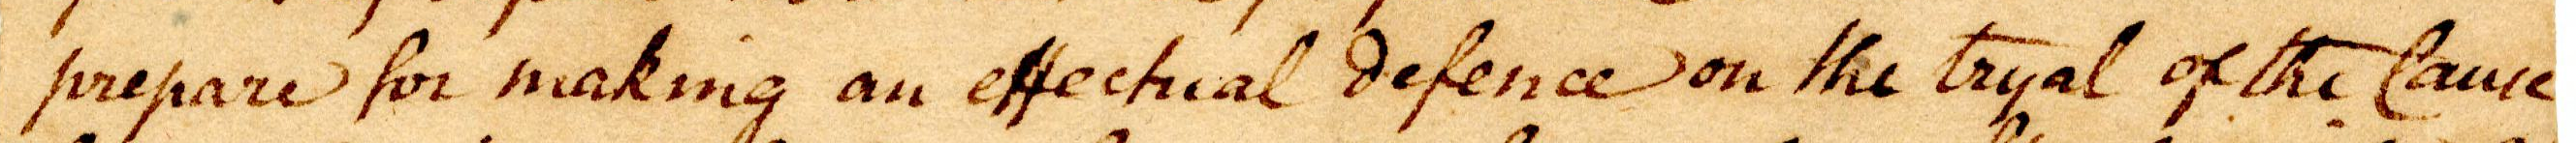prepare for making an effectual defence on the tryal of the Cause
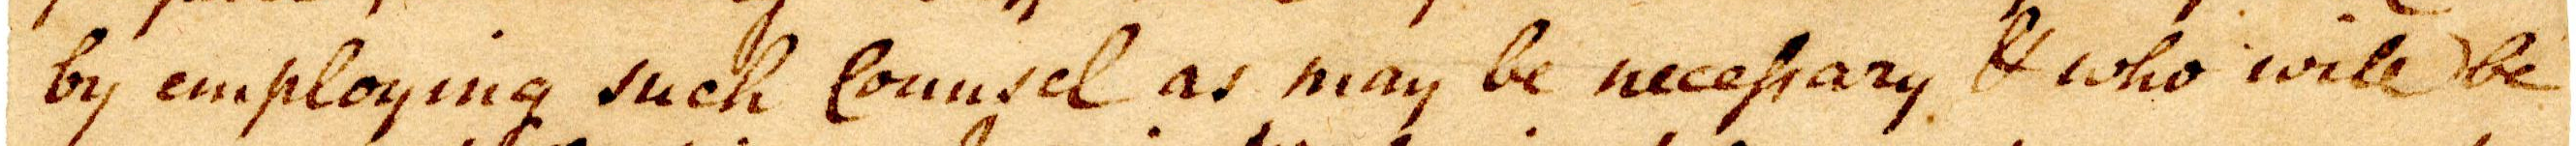by employing such Counsel as may be necessary & who will be
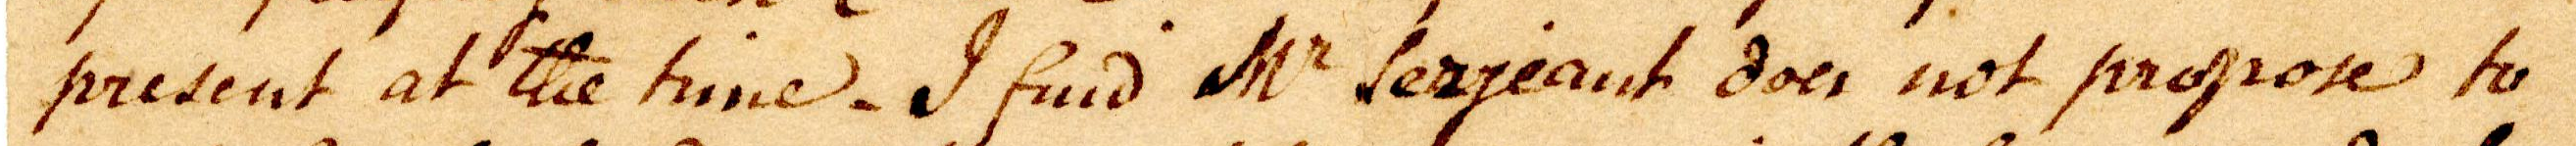present at the time. I find M^r Serjeant does not propose to
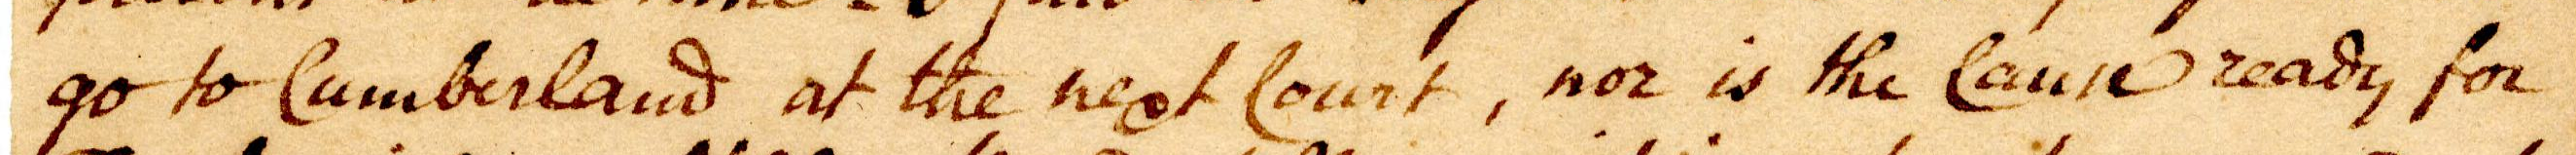go to Cumberland at the next Court, nor is the Cause ready for
